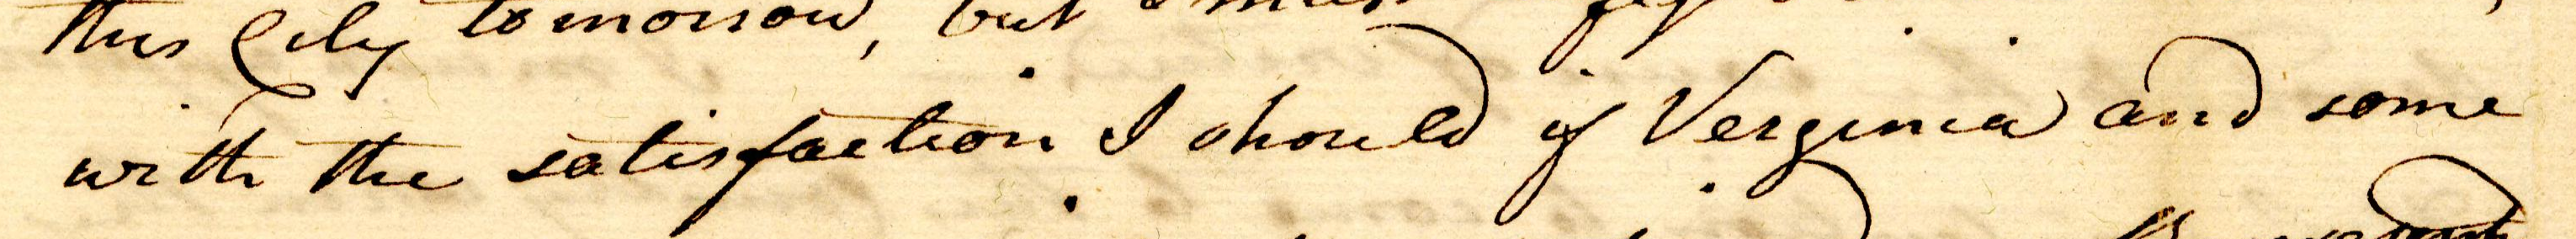with the satisfaction I should if Verginia and some
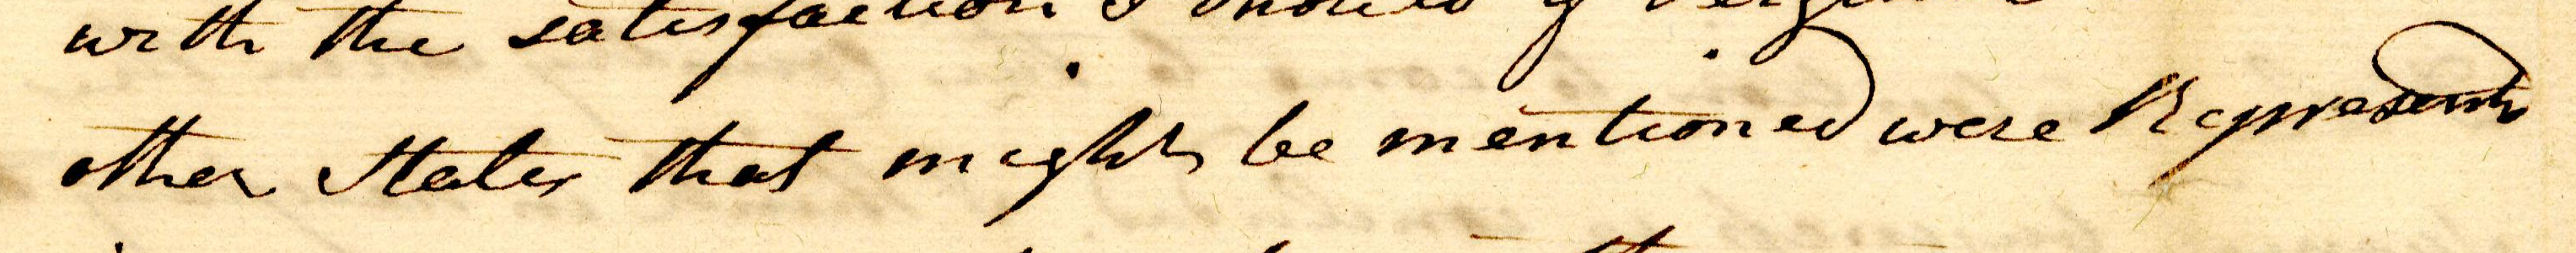other states that might be mentioned were Represented
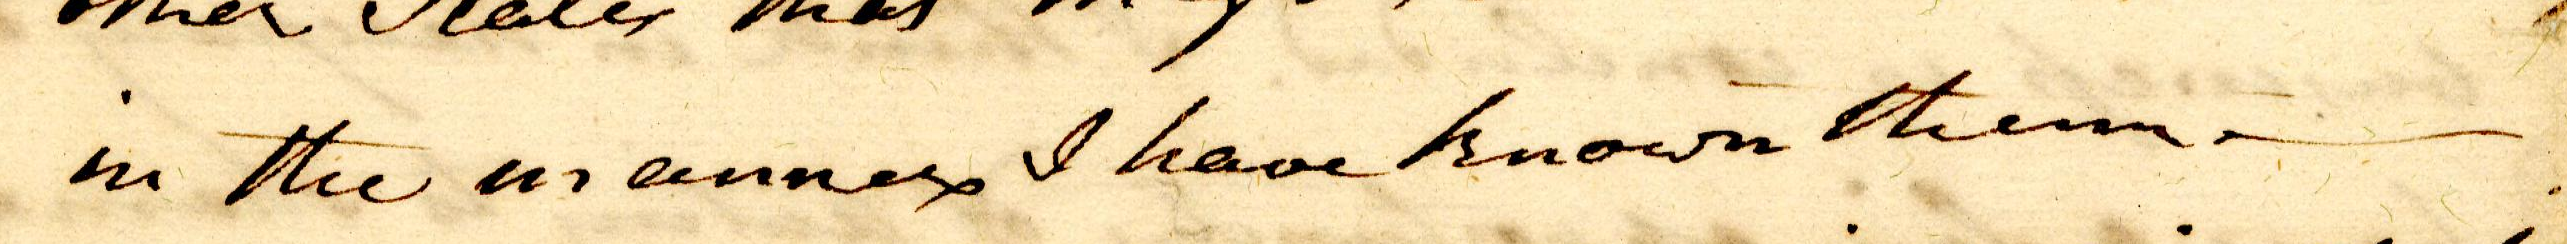in the manner I have known them.-
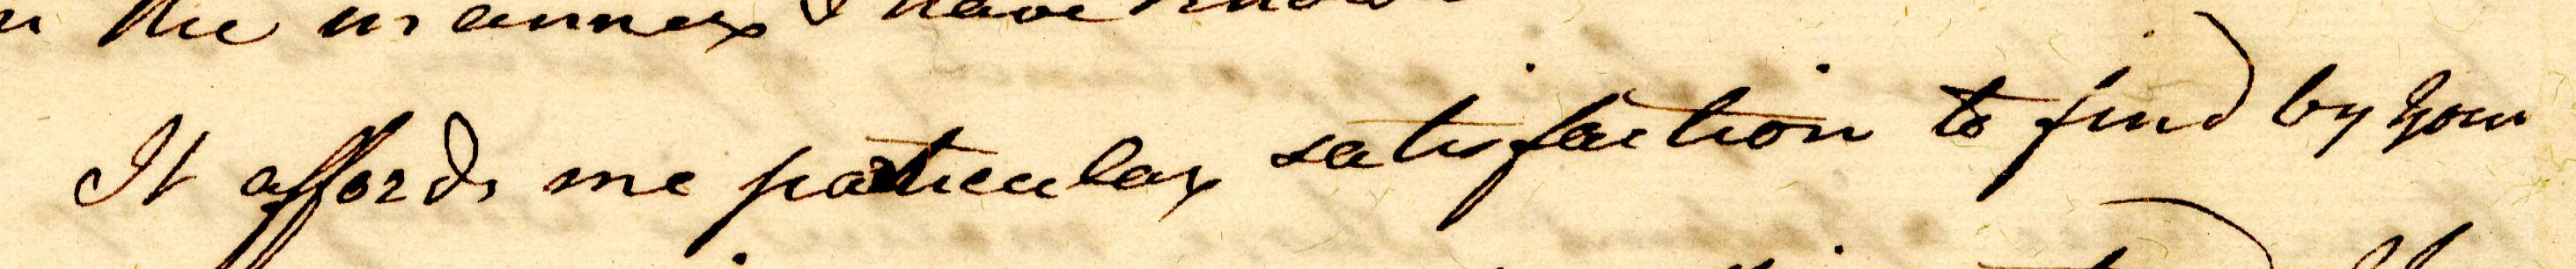It affords me particular satisfaction to find by your
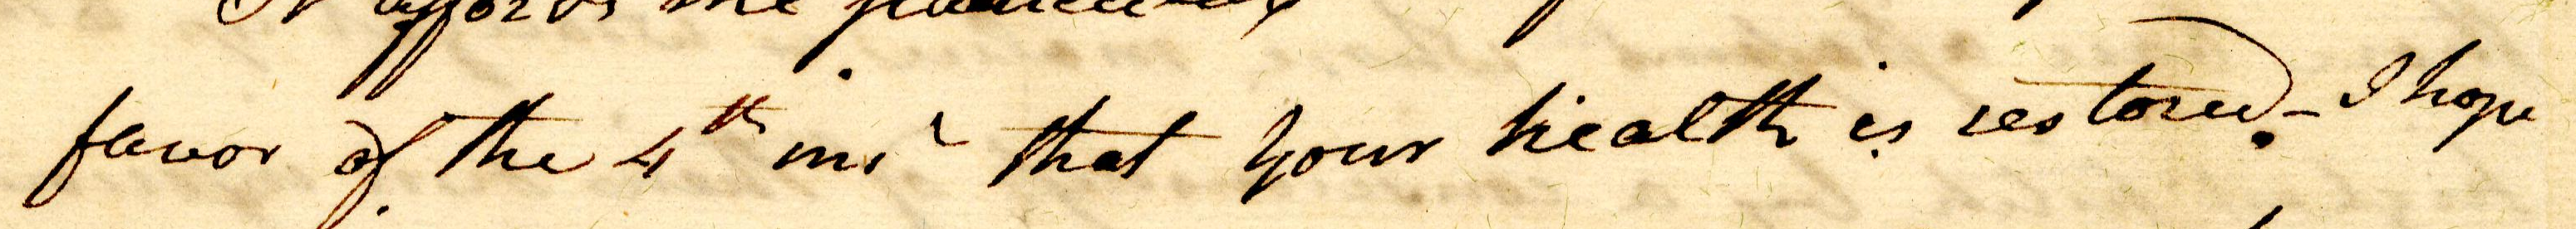favor of the 4^th ins^t. that your health is restored- I hope
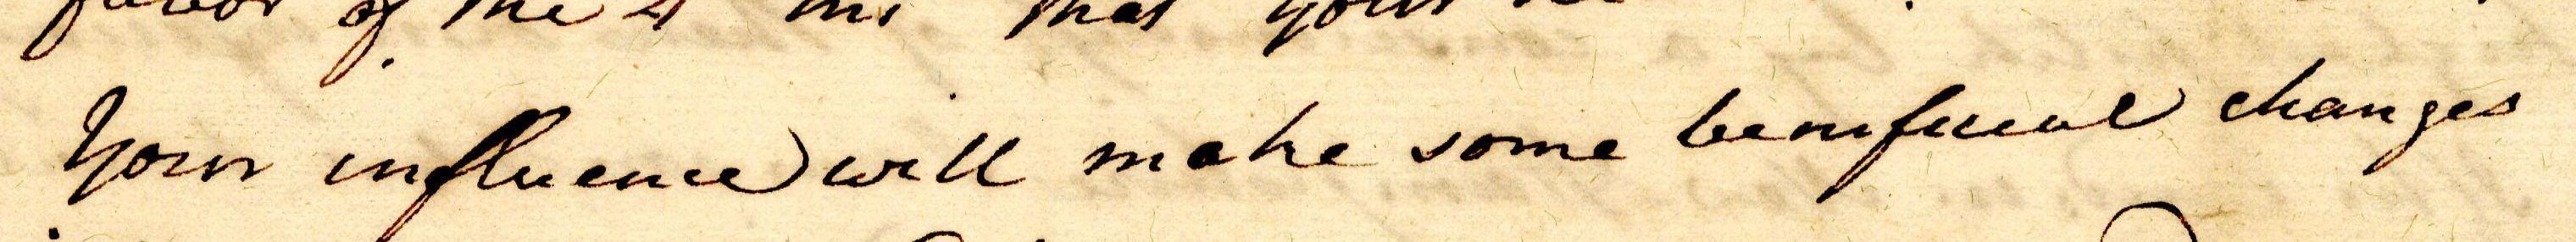Your influence will make some beneficial changes
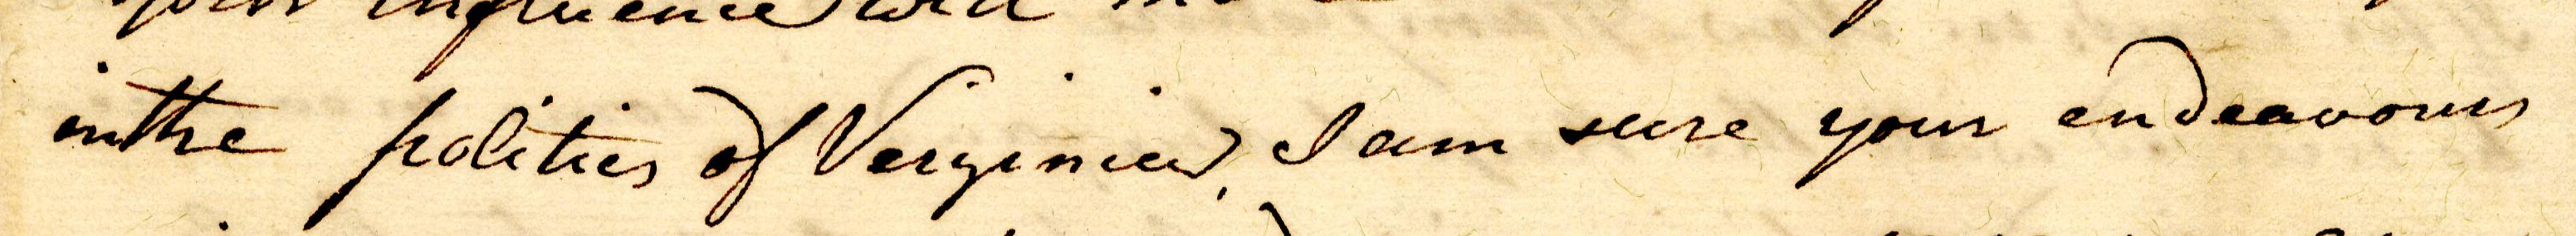in the polities of Verginia, I am sure your endeavors
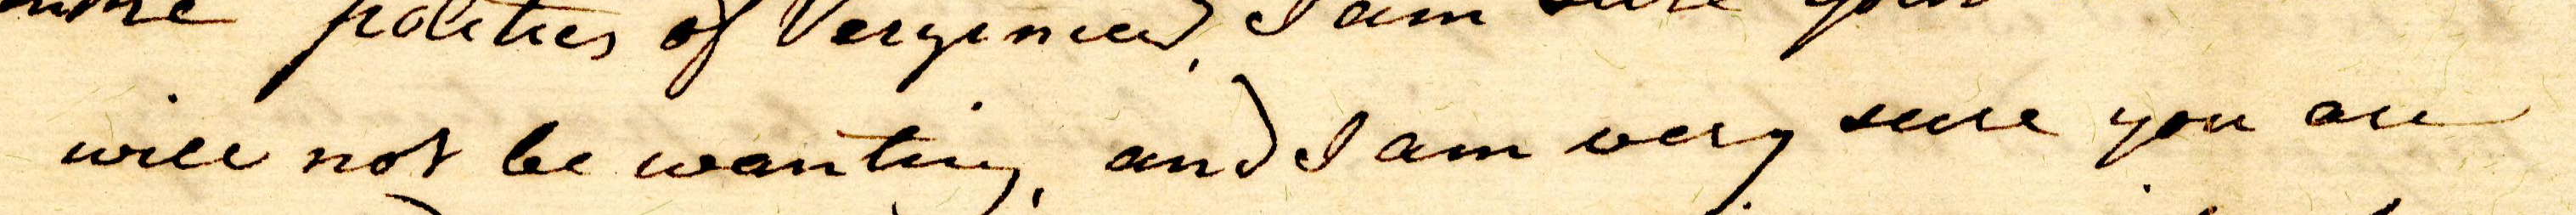will not be wanting, and I am very sure you are
